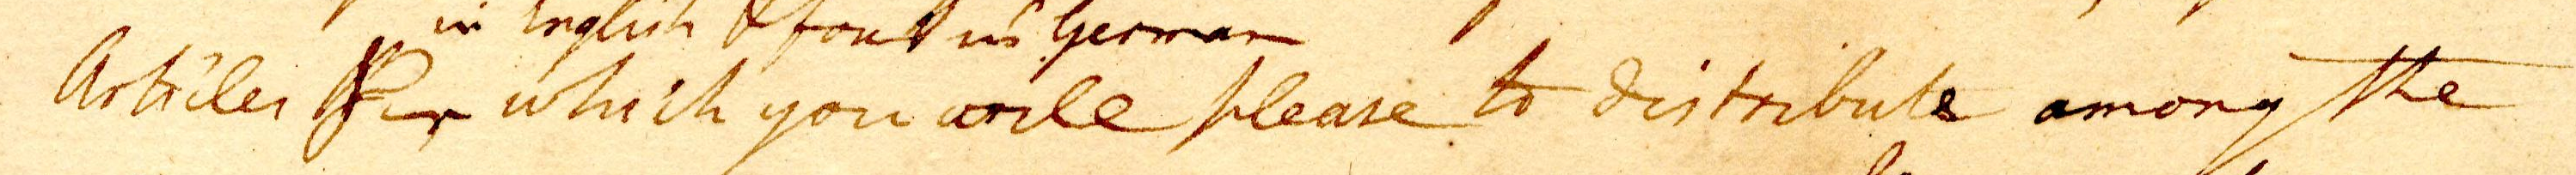Articles of which you will please to distribute among the
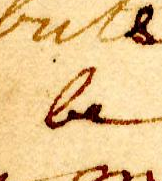be
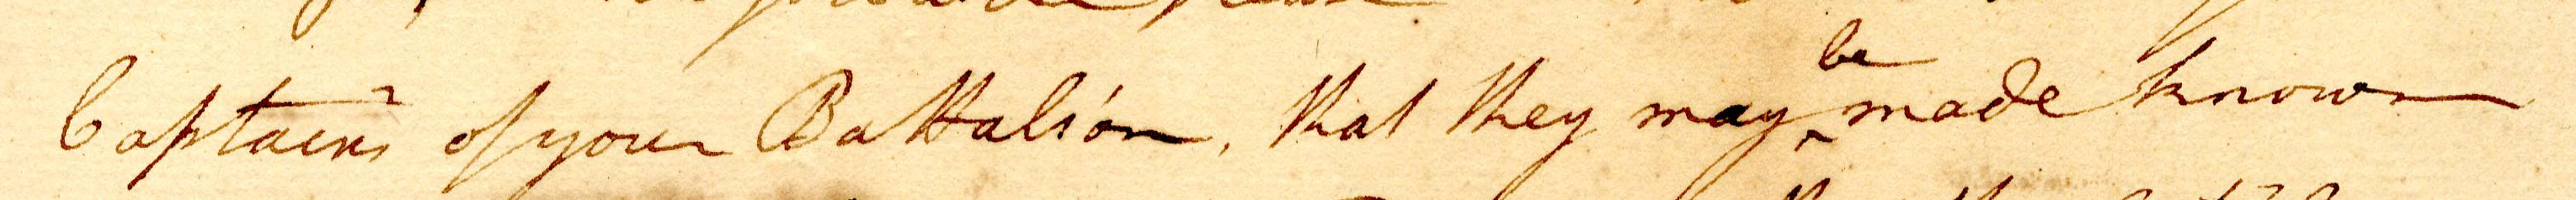Captains of your Battalion, that they may ^ made known
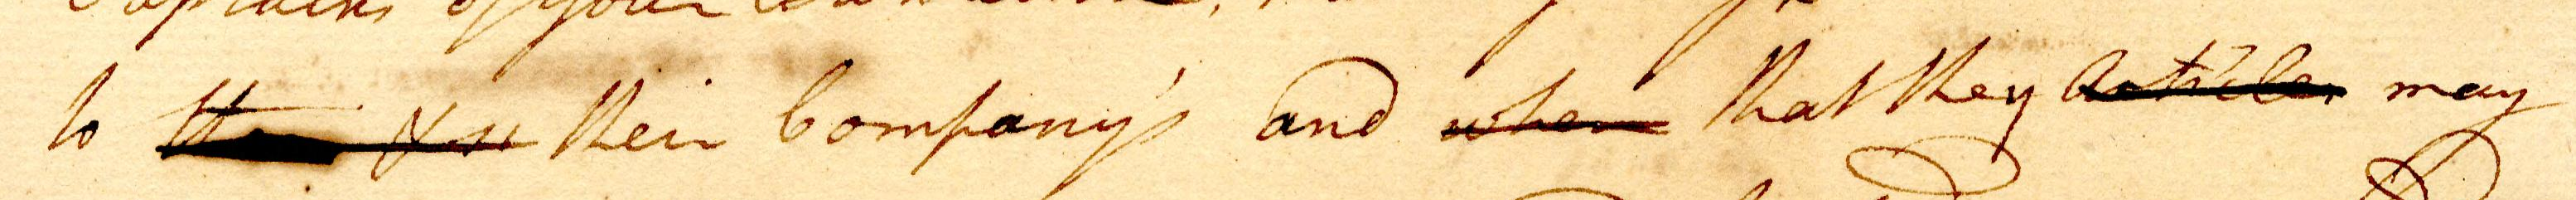to [them &] their Company's and [when] that they [Article] may
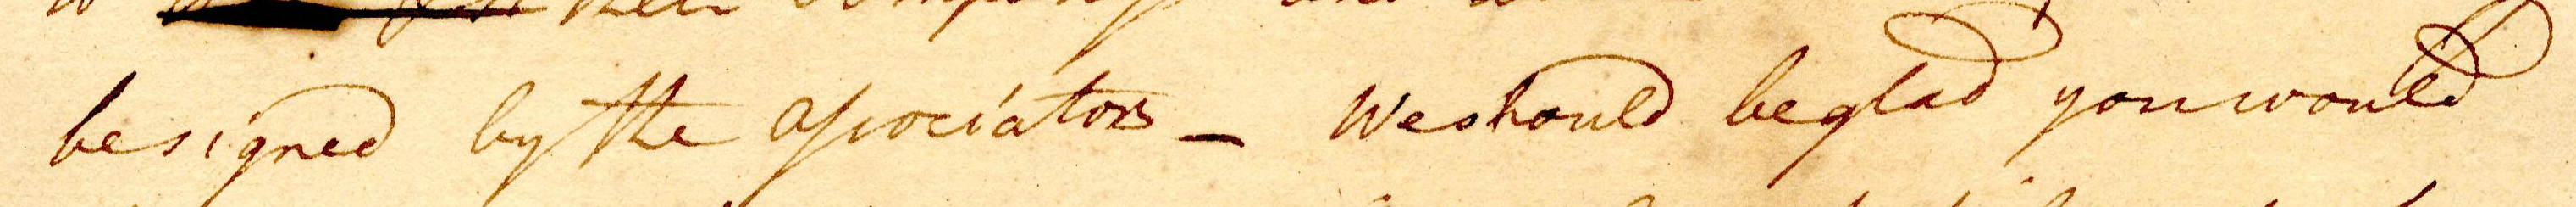be signed by the associators. Weshould be glad you would
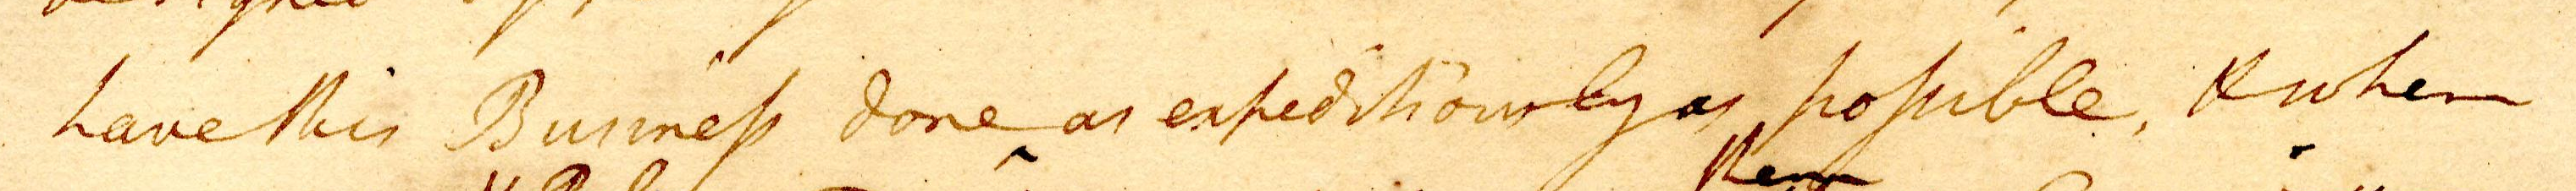have this Business done as expeditiously as possible, & when
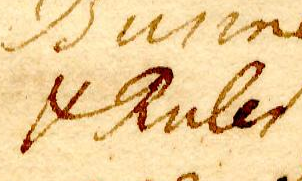& Rules
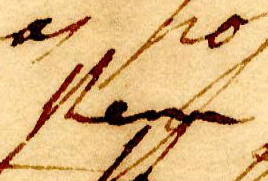them
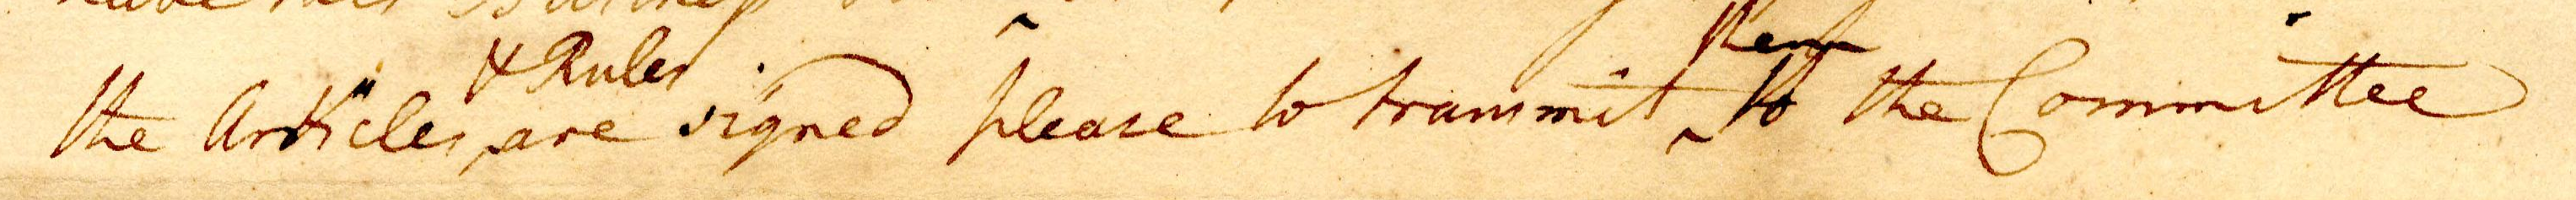the Articles ^ are signed please to transmit ^ to the Committee
